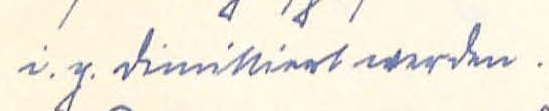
i.p. dimittiert werden
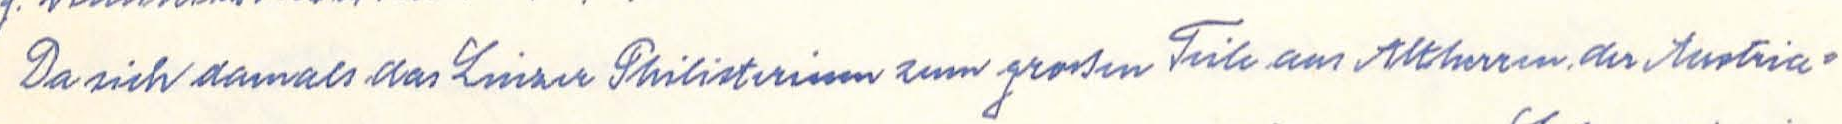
Da sich damals das Linzer Philisterium zum großen Teile aus Altherren der Austria-
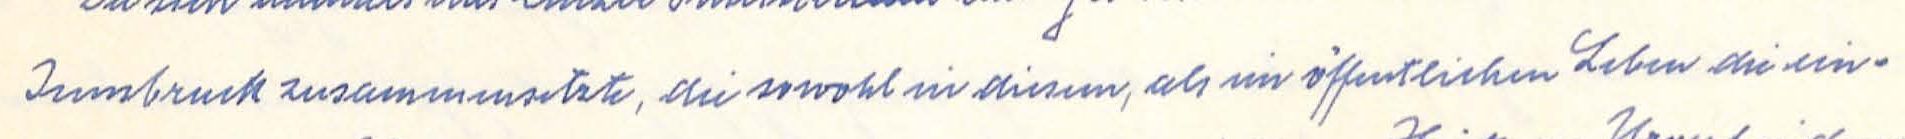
Innsbruck zusammensetzte, die sowohl in diesem, als im öffentlichen Leben die ein-
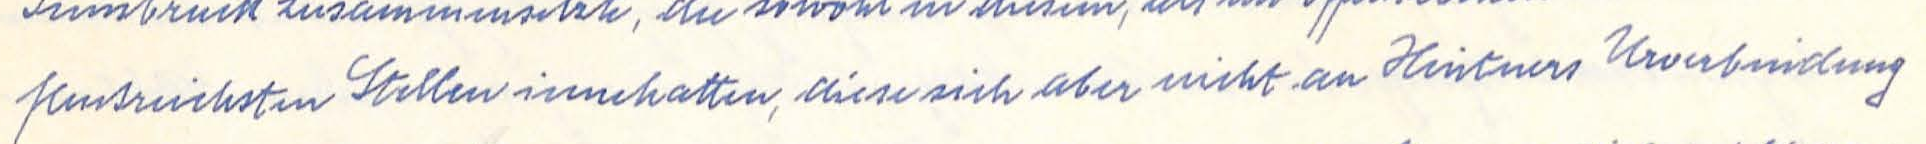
flussreichsten Stellen innehatten, diese sich aber nicht an Hintners Urverbindung
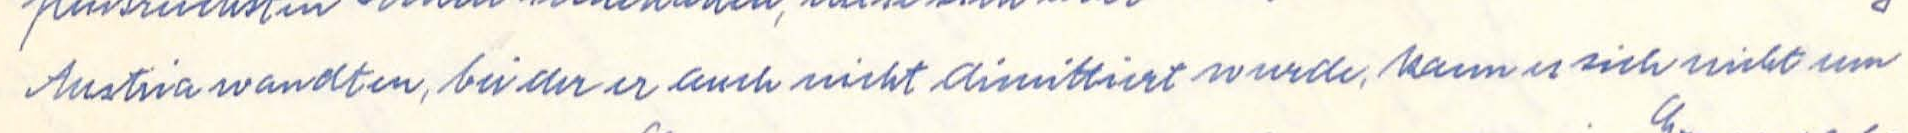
Austria wandten, bei der er auch nicht dimittiert wurde, kann es sich nicht um
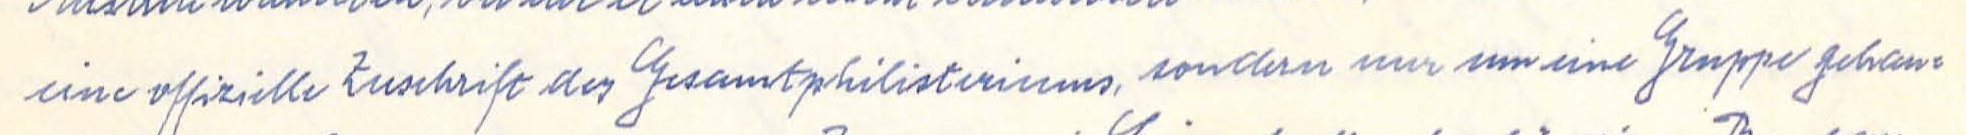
eine offizielle Zuschrit des Gesamtphilisteriums, sondern nur um eine Gruppe gehan-
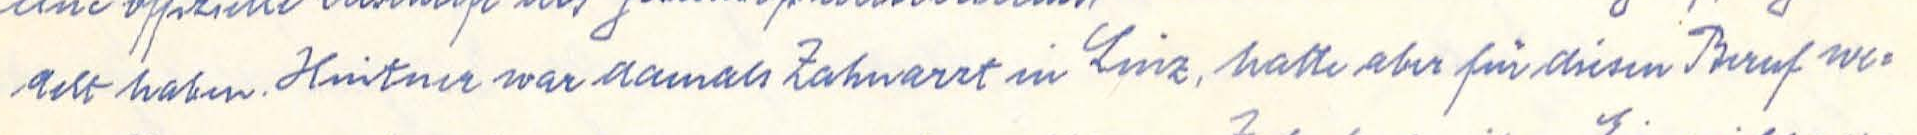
delt haben. Hintner war damals Zahnarzt in Linz, hatte aber für diesen Beruf we-
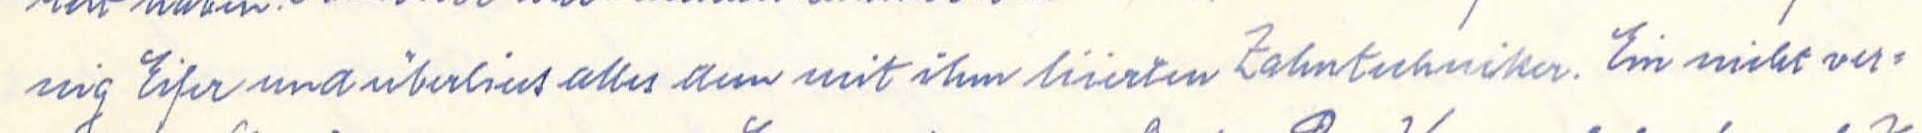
nig Eifer und überlies alles dem mit ihm liierten Zahntechnikern. Ein nicht ver-
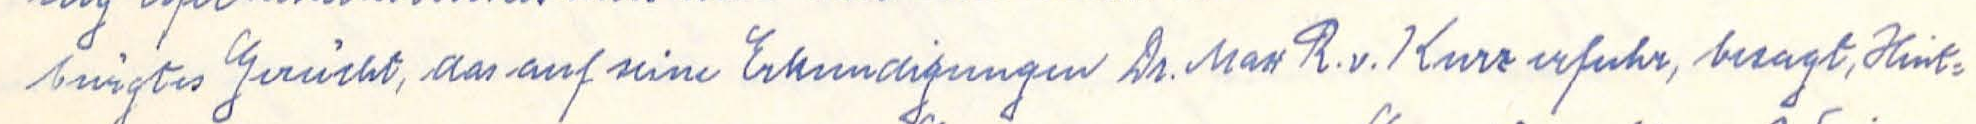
bürgtes Gericht, das auf seine Erkundigungen Dr. Max R. v. Kurz erfuhr, besagt, Hint-
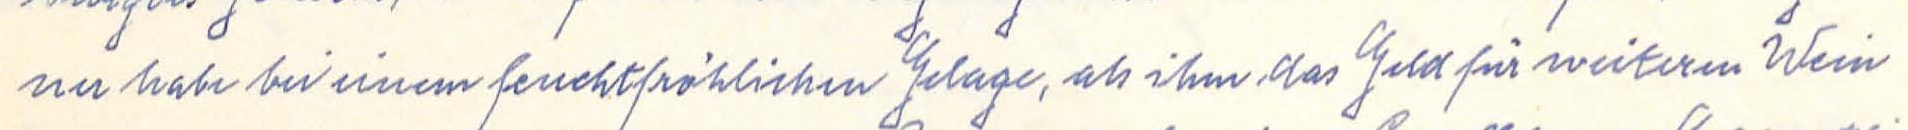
ner habe bei einem feuchtfröhlichen Gelage, als ihm das Geld für weiteren Wein
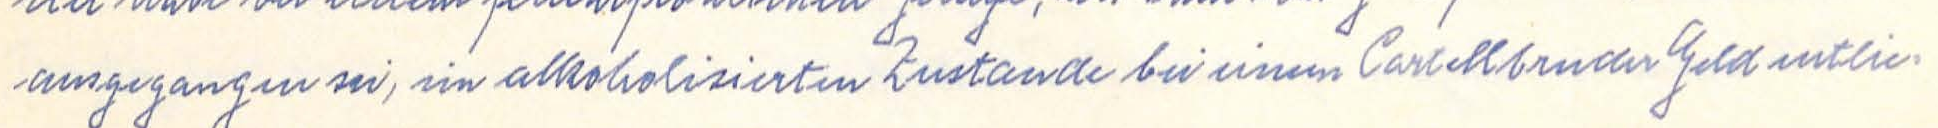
ausgegangen sei, im alkoholisierten Zustande bei einem Cartellbruder Geld entlie-
